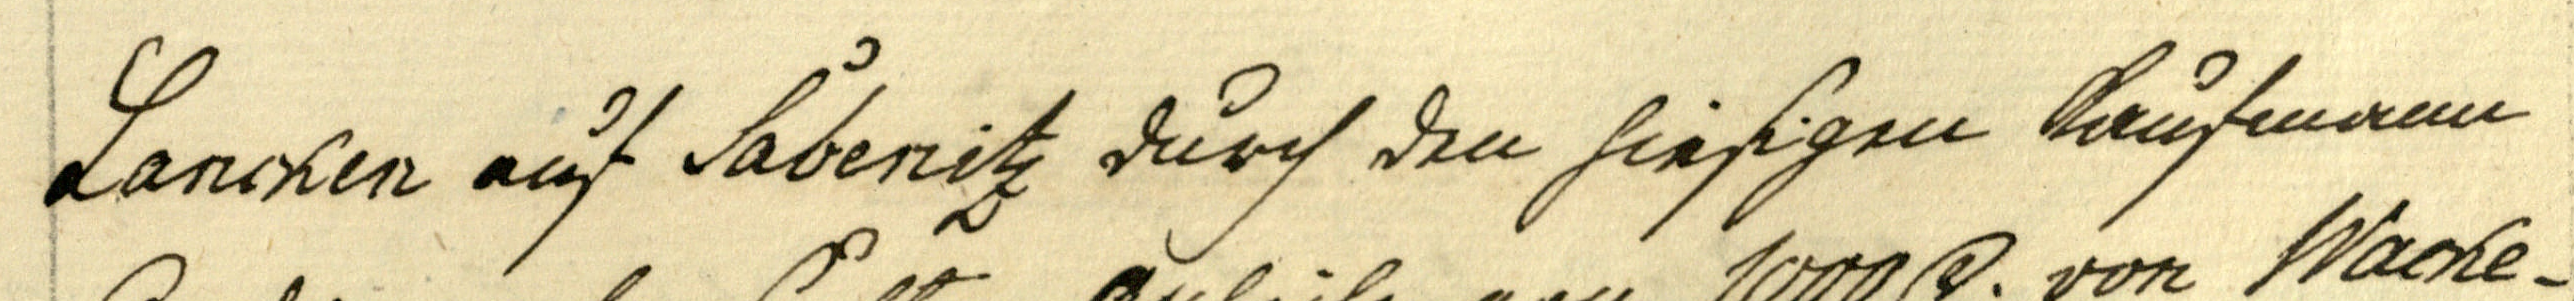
Lancken auf Sabenitz durch den hiesigen Kaufmann
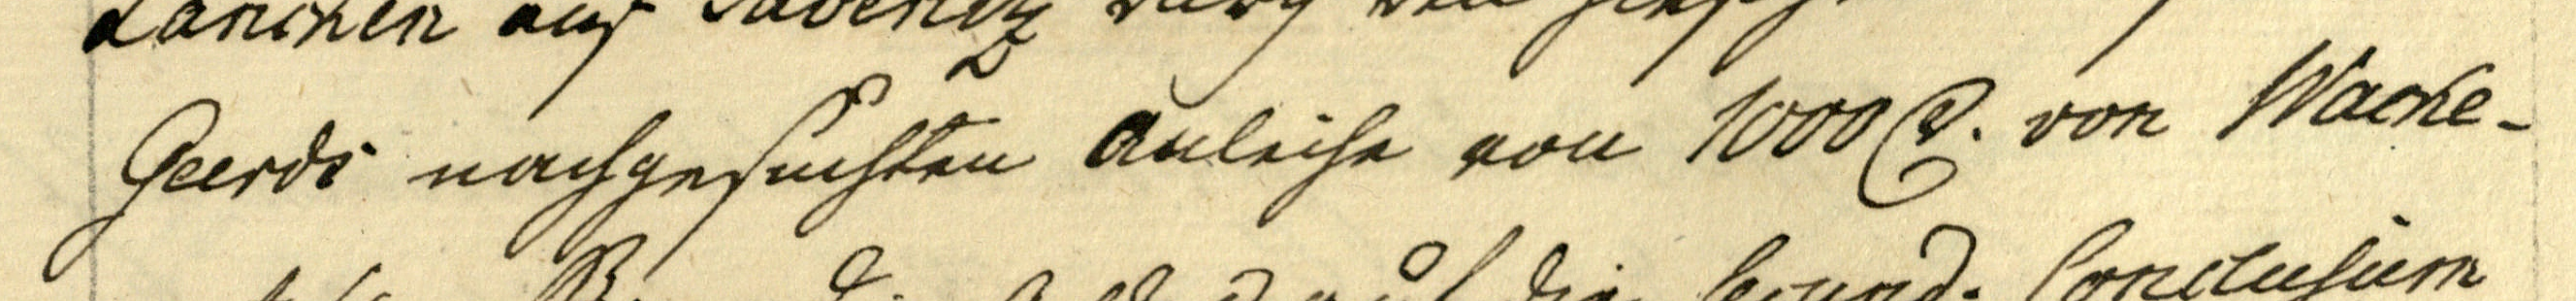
Geerds nachgesuchten Anleihe von 1000 l. von Wacke¬
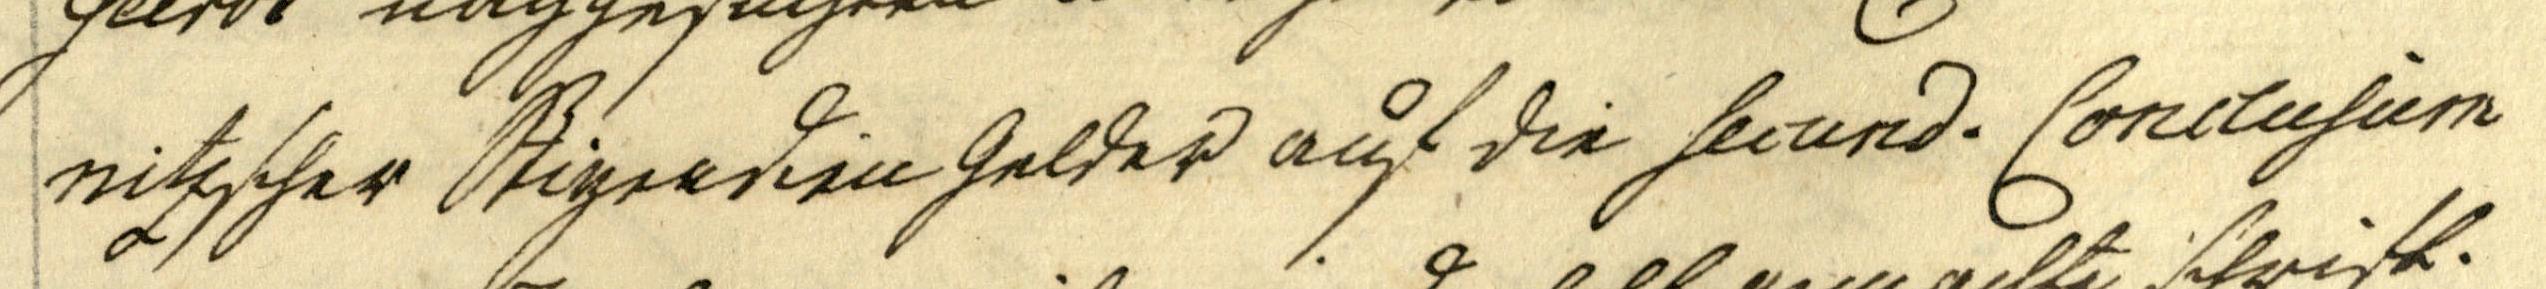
nitzscher Stipendien Gelder auf die secund. Conclusum
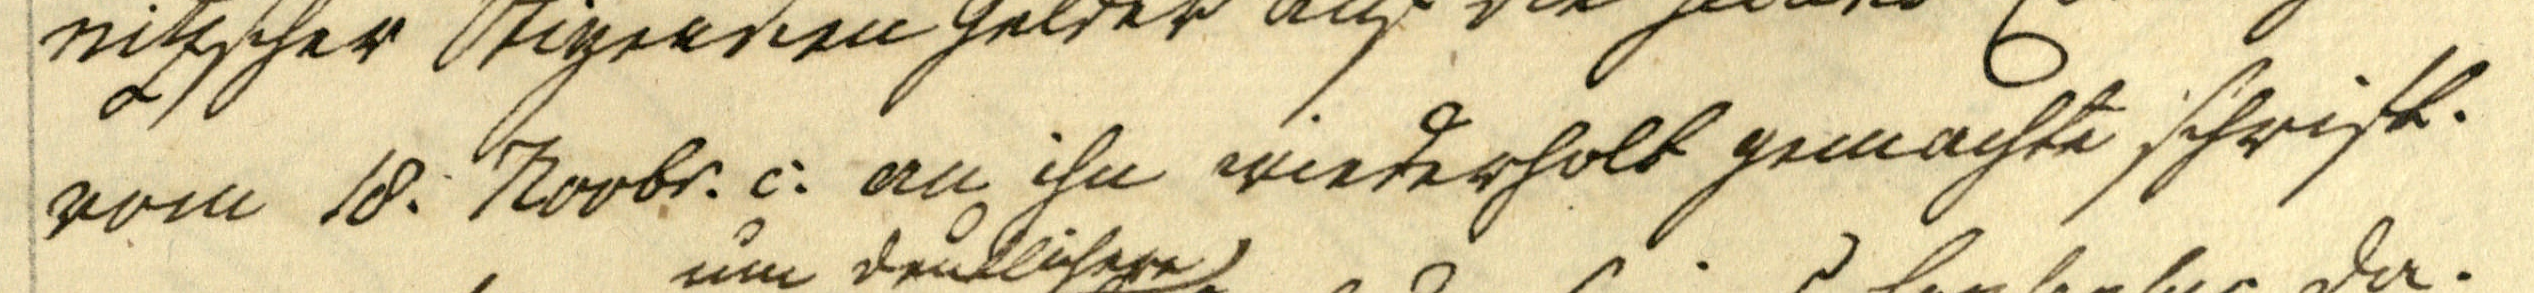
vom 18. Novbr. c. an ihn wiederholt gemachte schrift¬
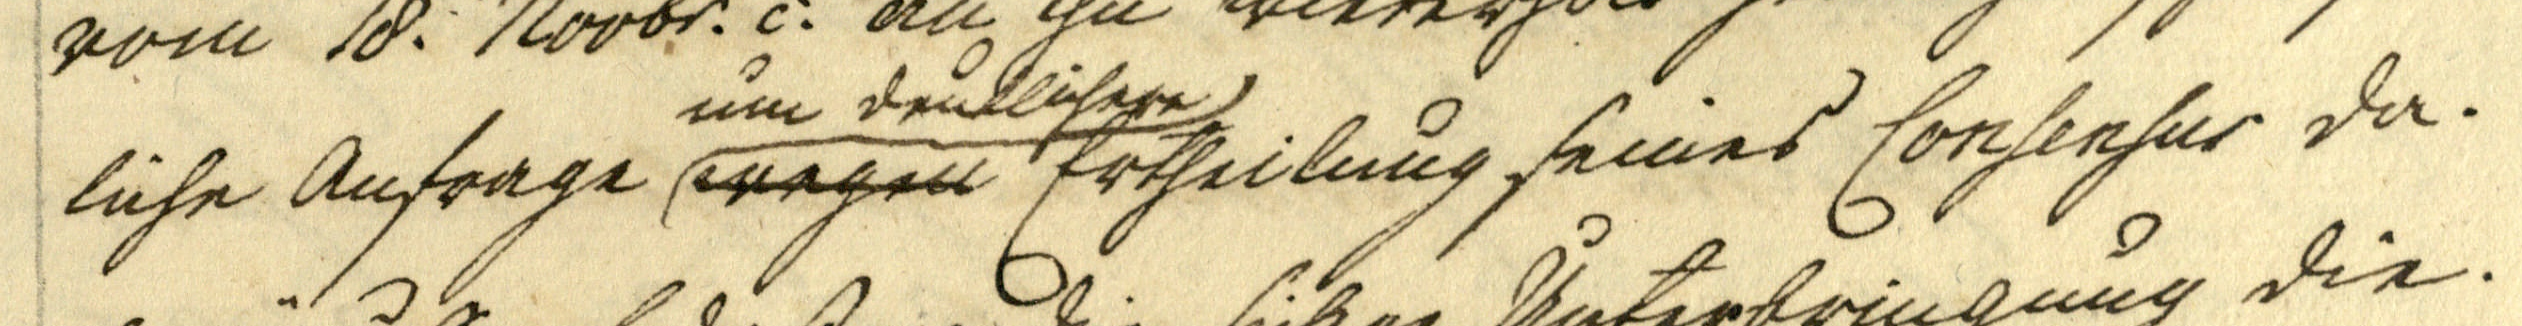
liche Anfrage deutlichere wegen Ertheilung seines Consensus da¬
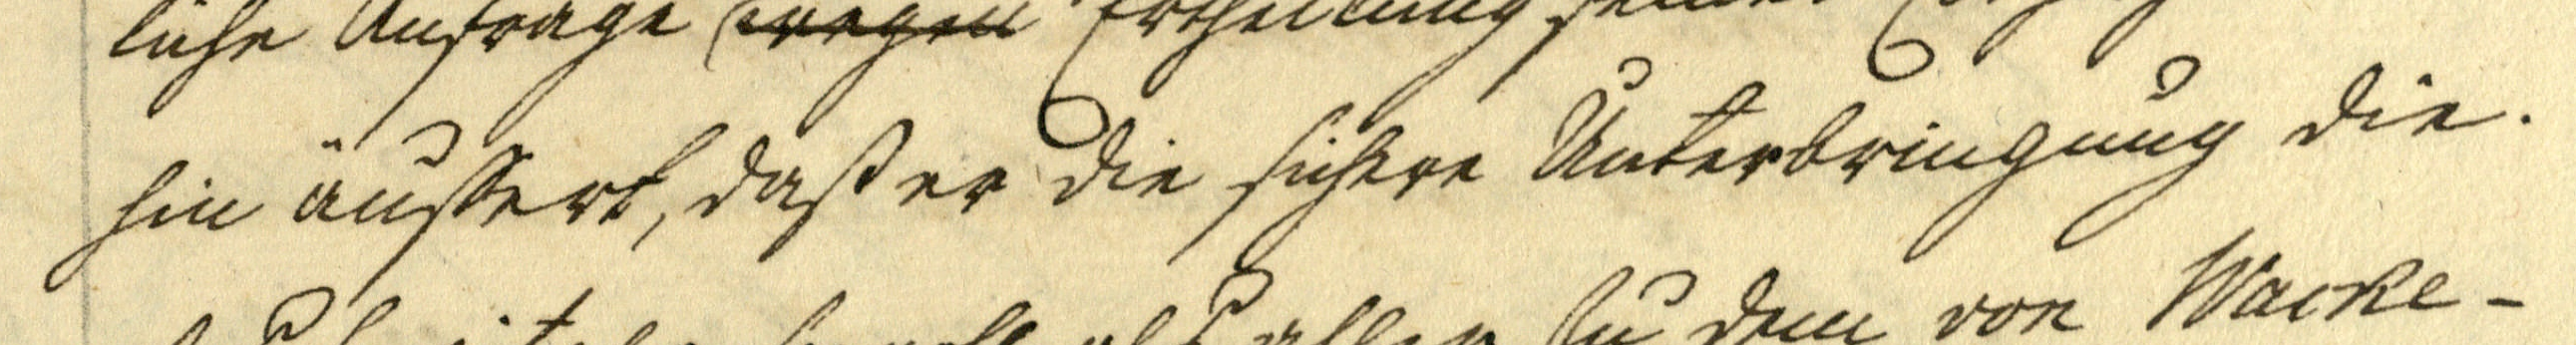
hin äussert, daß er die sichere Unterbringung die¬
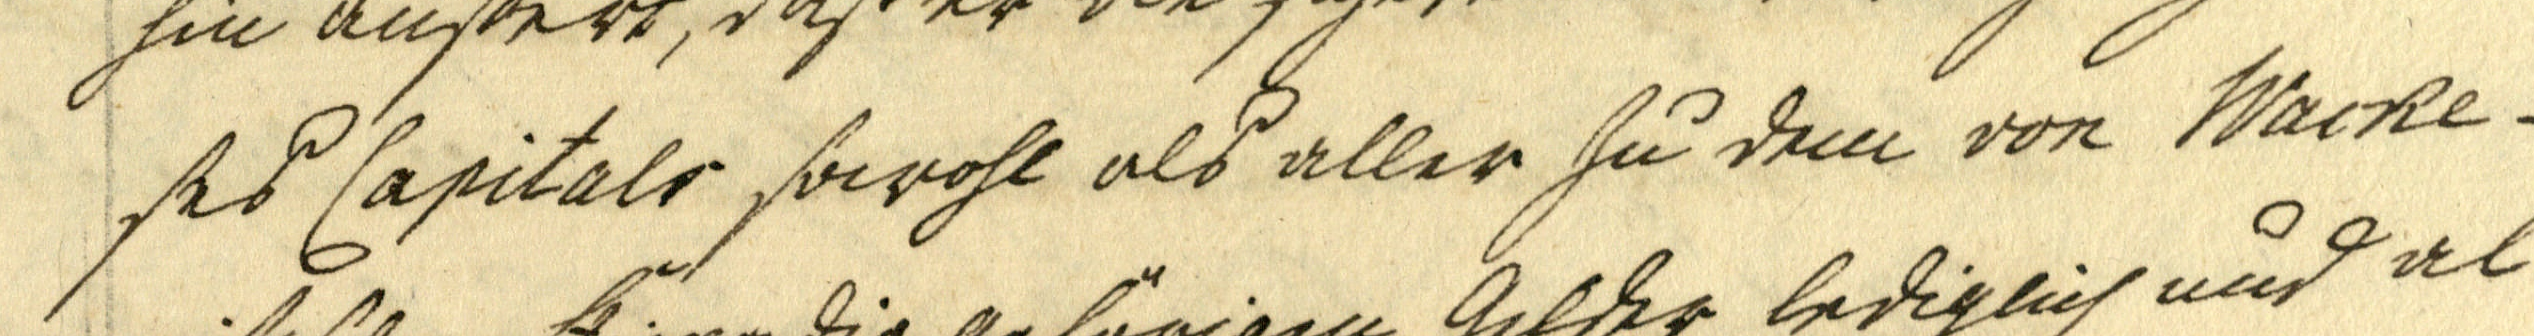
ses Capitals sowohl als aller zu dem von Wacke¬
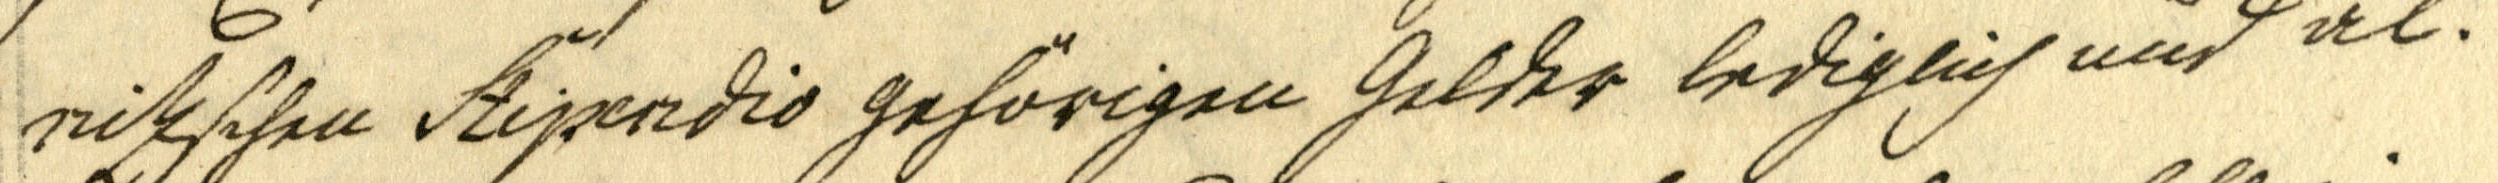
nitzschen Stipendio gehörigen Gelder lediglich und al¬
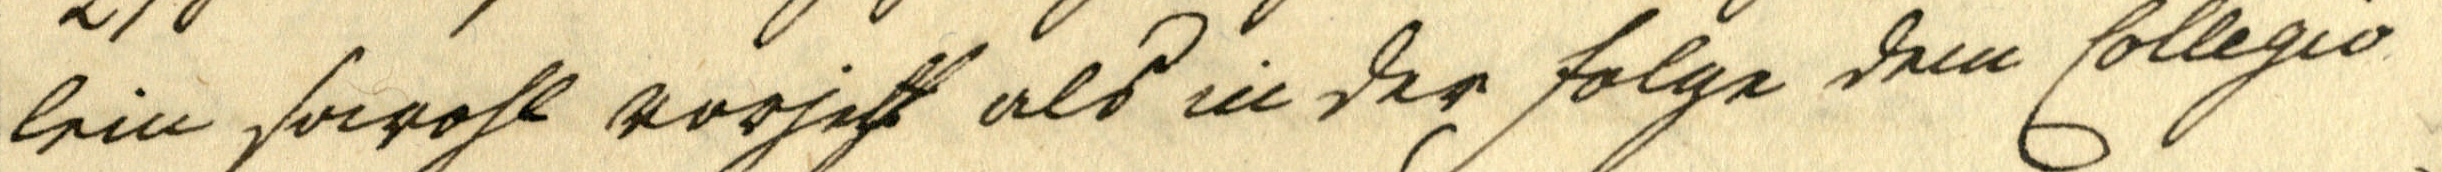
lein sowohl vorjetzt als in der Folge dem Collegio
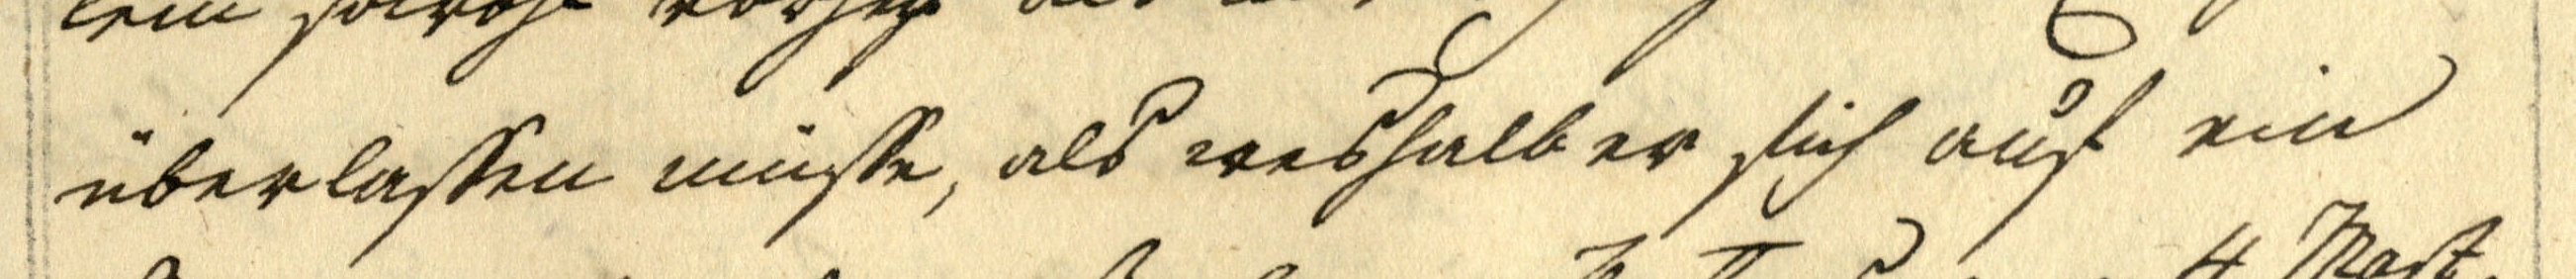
überlassen müsse, als weshalb er sich auf ein
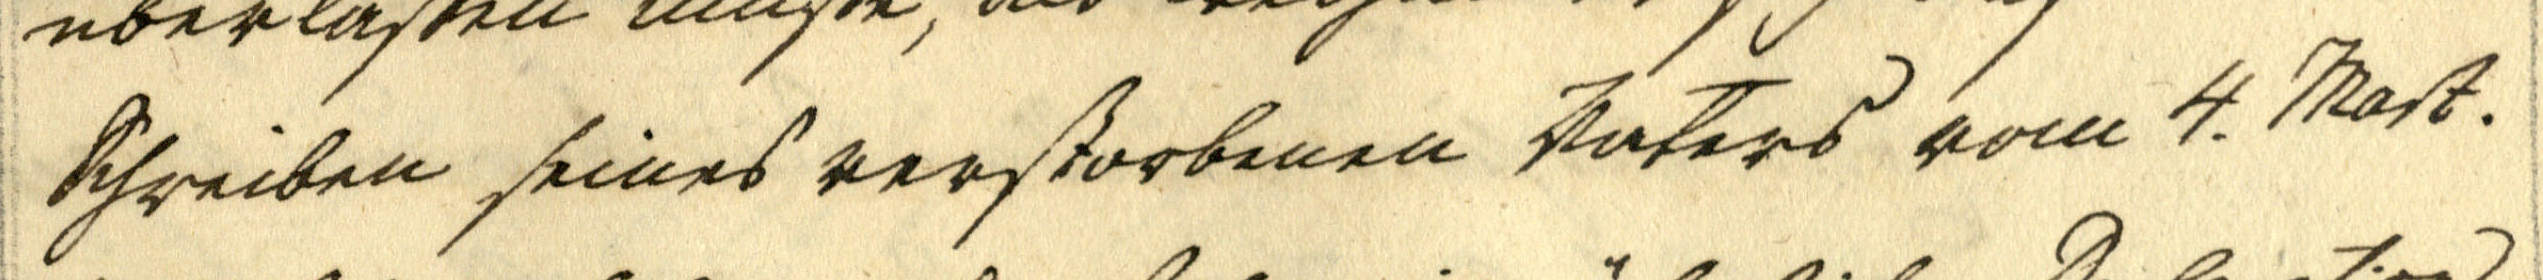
Schreiben seines verstorbenen Vaters vom 4. Mart.
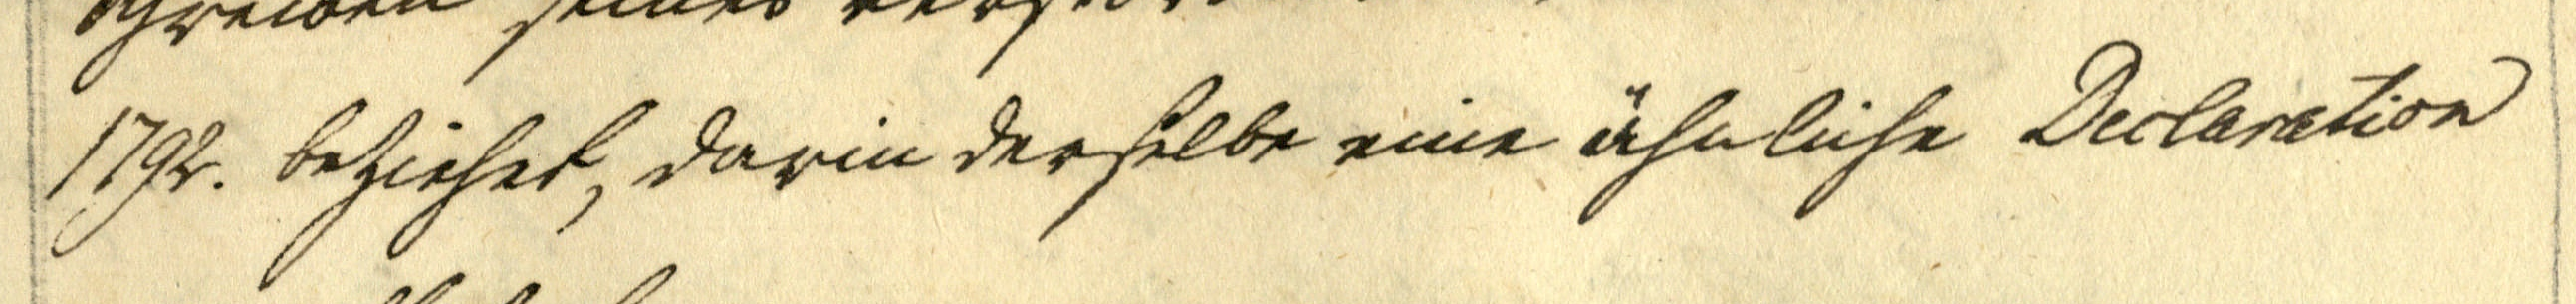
1792. beziehet, darin derselbe eine ähnliche Declaration
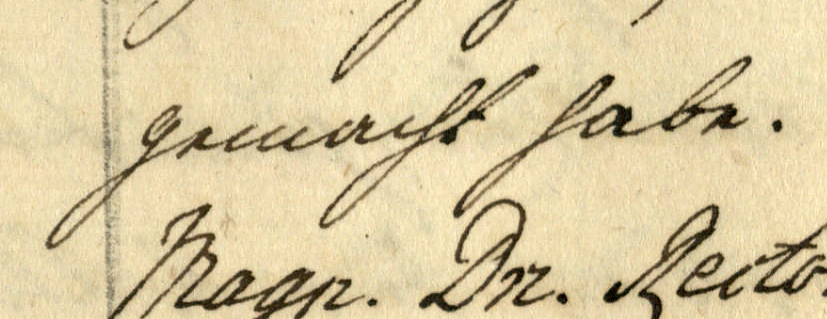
gemacht habe.
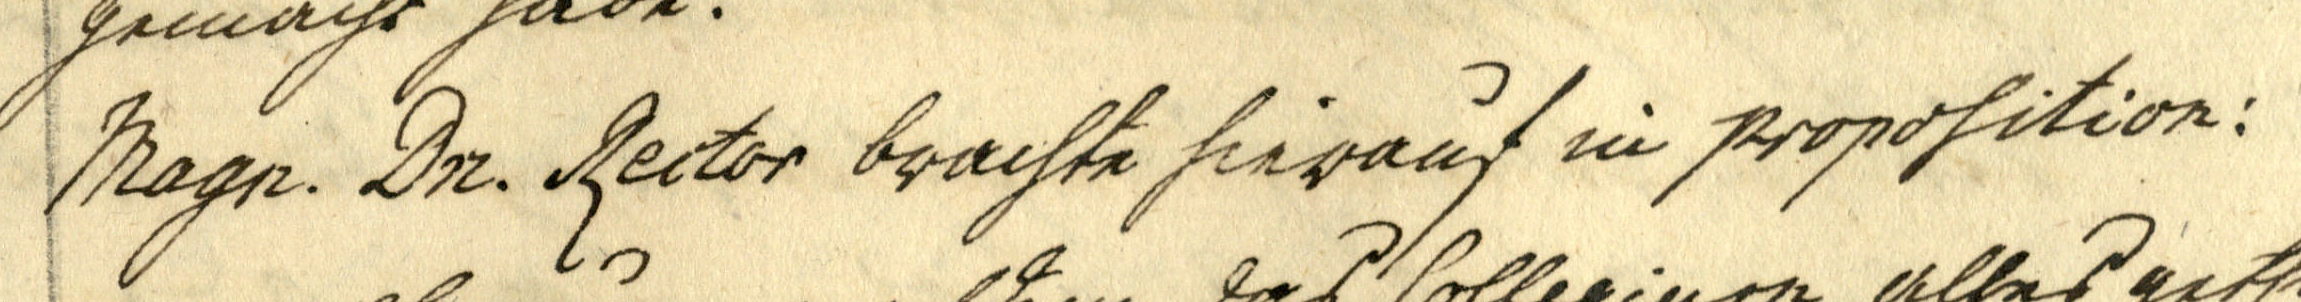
Magn. Dn. Rector brachte hierauf in proposition:
